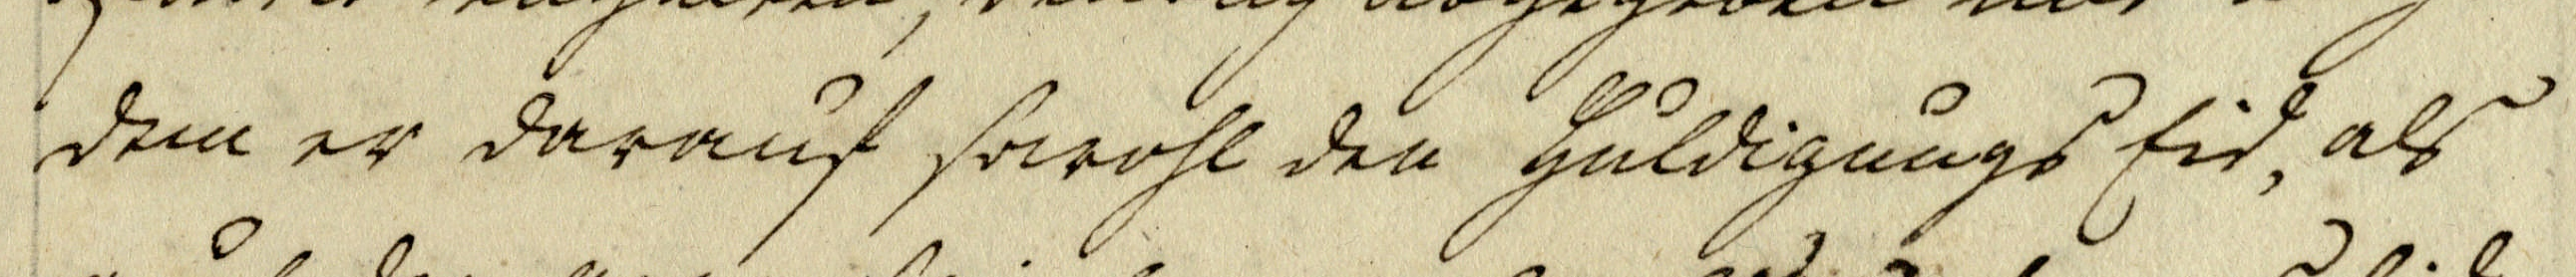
dem er darauf sowohl den Huldigungs Eid, als
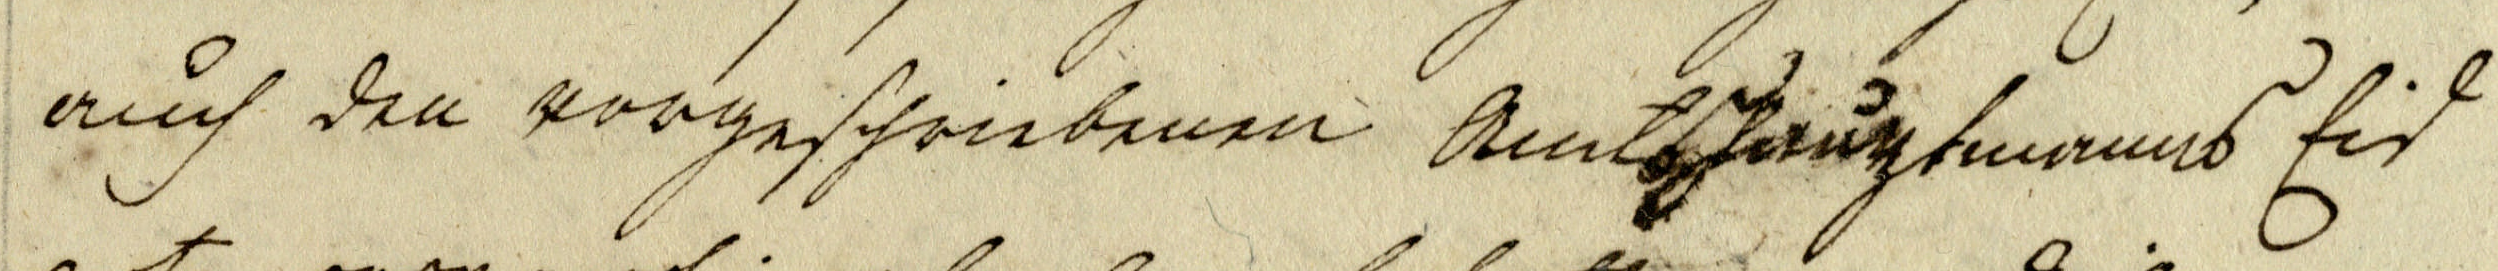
auch den vorgeschriebenen Amtshauptmanns Eid
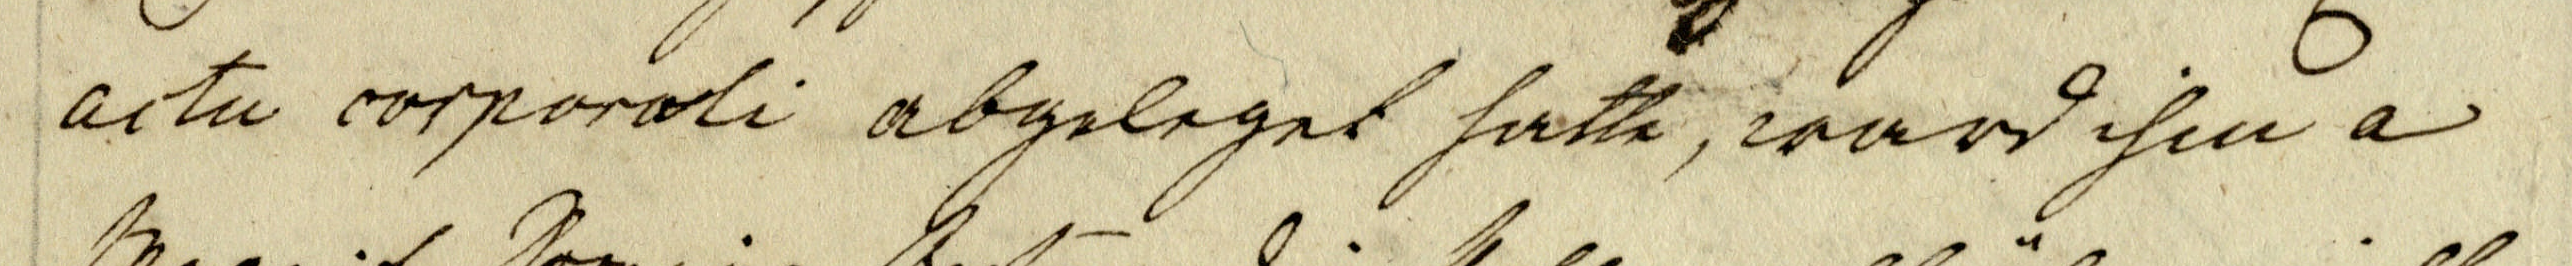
actu corporali abgeleget hatte, ward ihm a
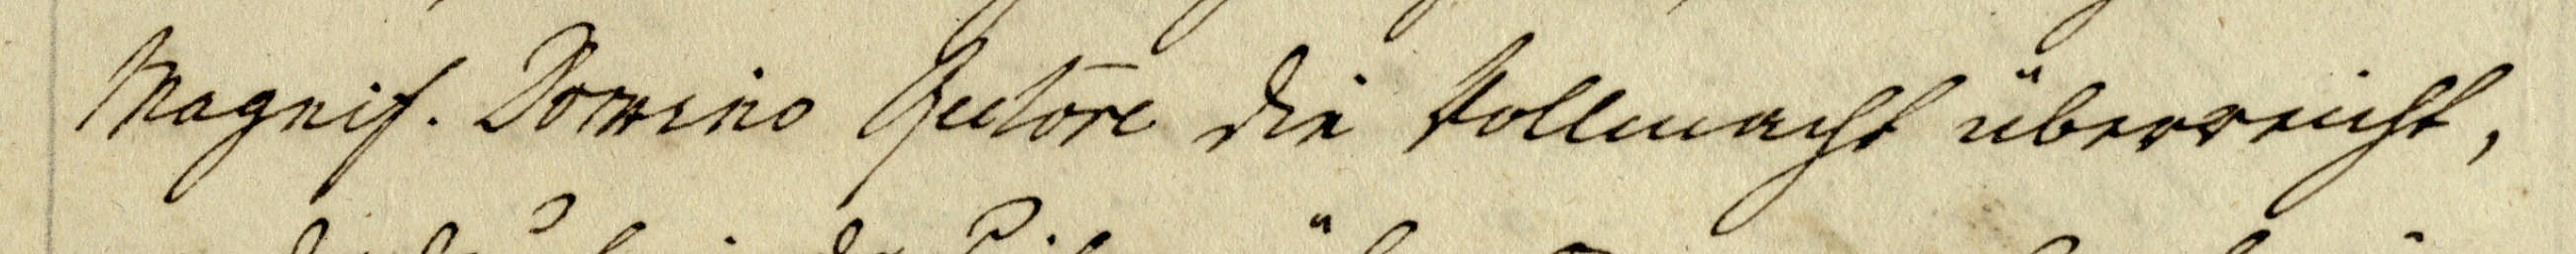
Magnif. Domino Rectore die Vollmacht überreicht,
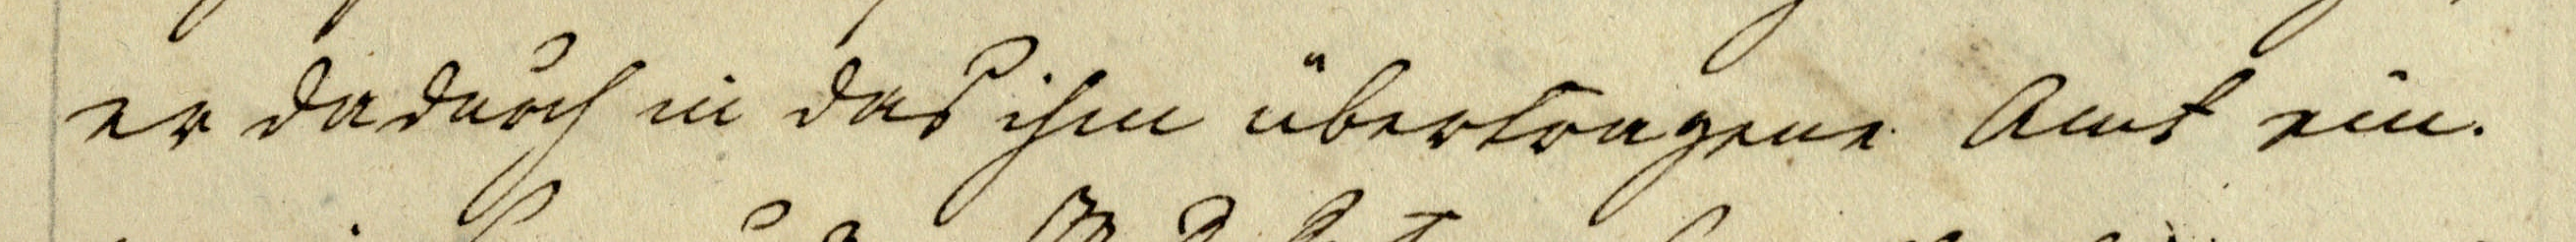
er dadurch in das ihm übertragene Amt ein¬
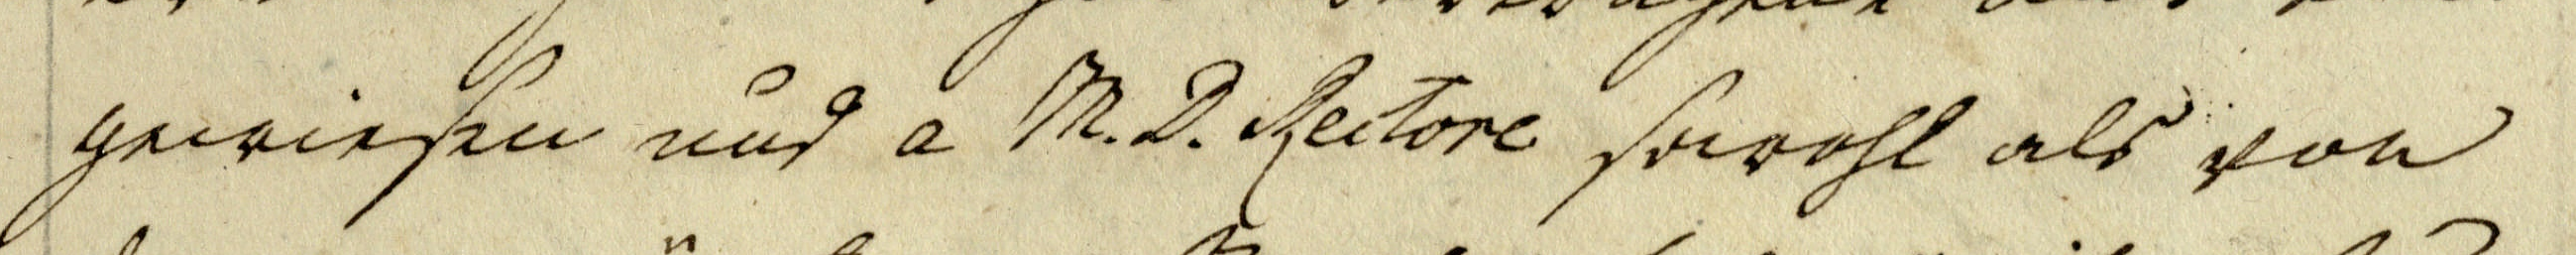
gewiesen und a M. D. Rectore sowohl als von
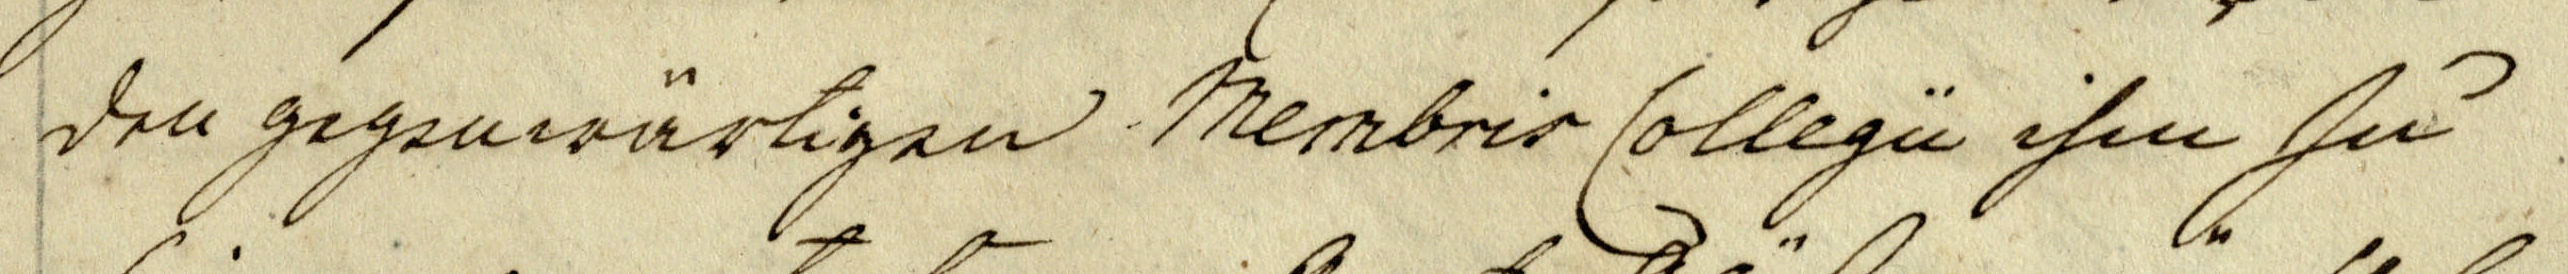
den gegenwärtigen Membris Collegii ihm zu
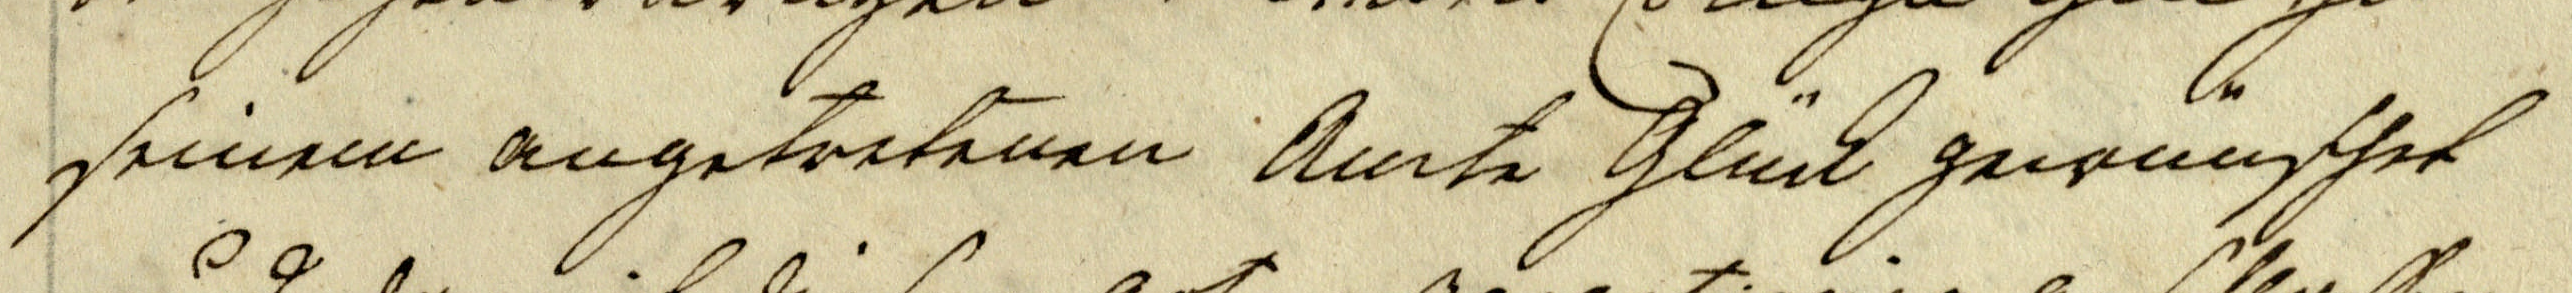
seinem angetretenen Amte Glück gewünschet
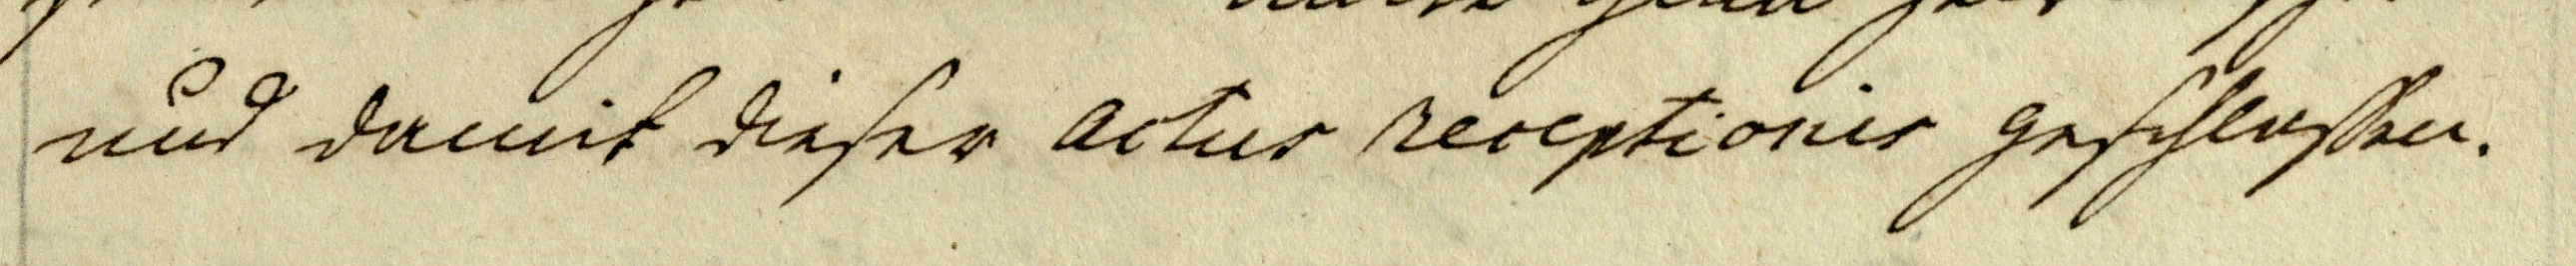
und damit dieser Actus receptionis geschlossen.
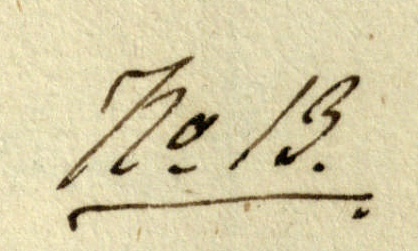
No 13.
